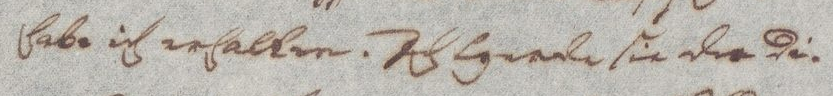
habe ich erhalten. Ich werde sie der Di-
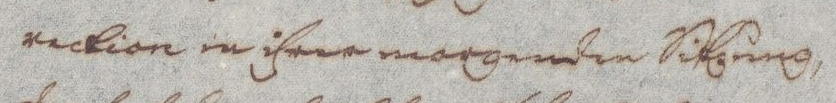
rection in ihrer morgenden Sitzung,
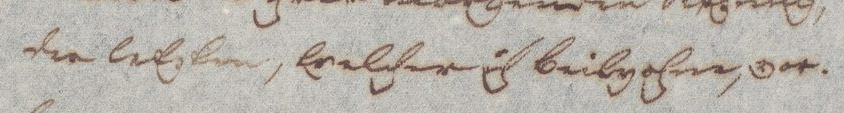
der letzten, welcher ich beiwohne, vor-
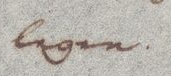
legen.
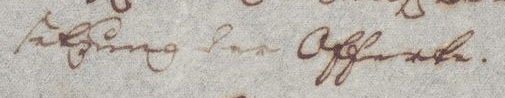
setzung der Offerte.
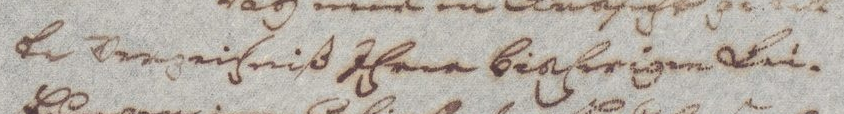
te Verzeichniß Ihrer bisherigen Lei-
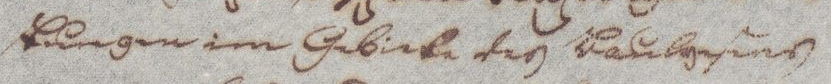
stungen im Gebiete des Bauwesens
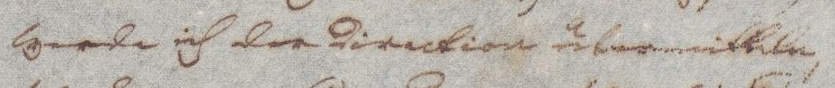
werde ich der Direction übermitteln,
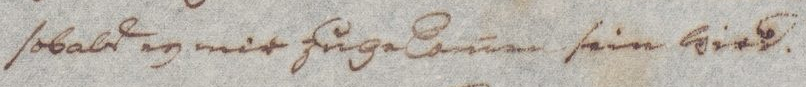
sobald es mir zugekommen sein wird.
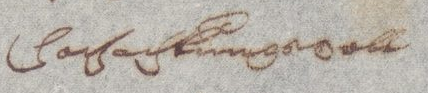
Hochachtungsvoll
